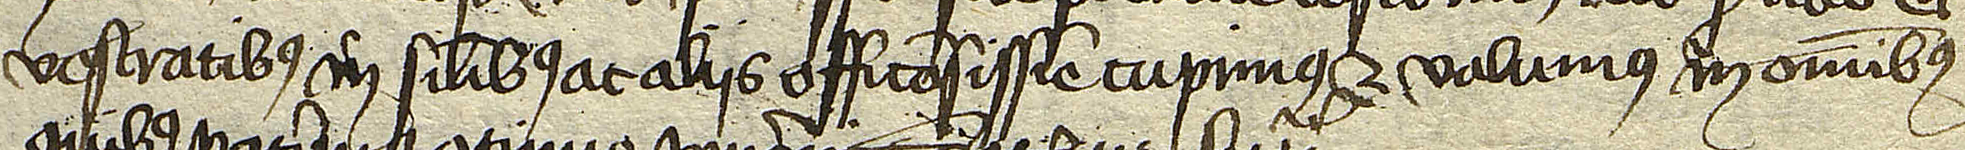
vestratib* in filib* ac aliis offic*oſiſſi*e cupim* @ volum* in om*ib*
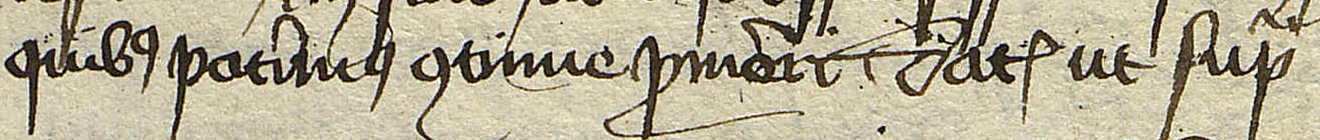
quib* pot*im* *tinue p*me*ri / Dat* ut ſup*
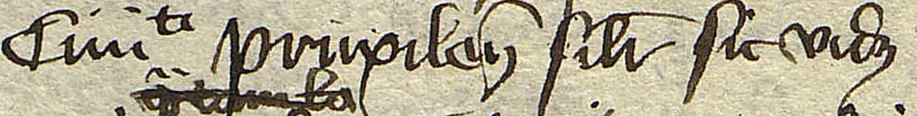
Ciui*ti Prinxilen* ſi*l*r ſic vid*
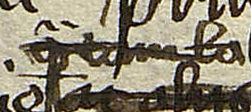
%%%%%%
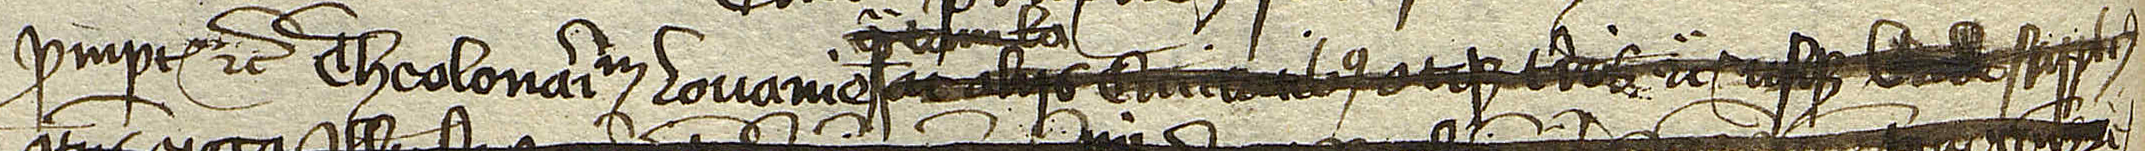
P*mpt* ec* Theolona*i* Louanie ac aliis Ciuitatib* %%%% t*cis ec* uſq* vnde ſi%%%%
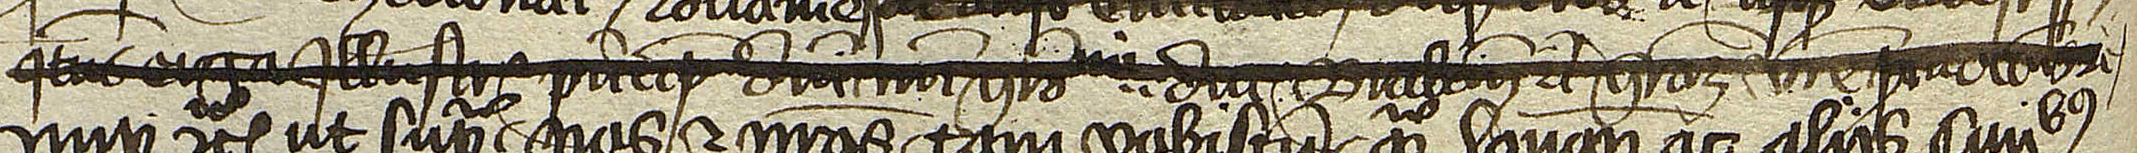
*tus ergo Illuſtr* p*%%% dni* / nri* gro* ~ dni* Brab%%* %% gro* vre* %%%
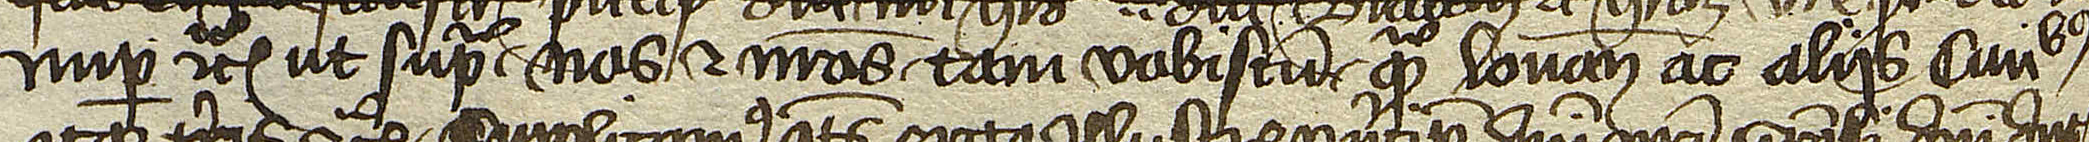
nup* ec* ut ſup* / nos @ n*ros / tam vobiſcu* / q* Louan* ac aliis Ciuib*
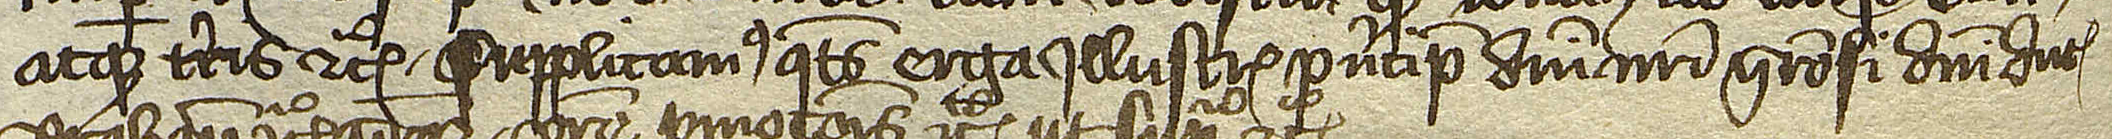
atq* t*ris ec* ſupplicam* q*t*s erga Illuſtr* p*ncip* d*ni n*ri g*r*oſi d*ni duc*
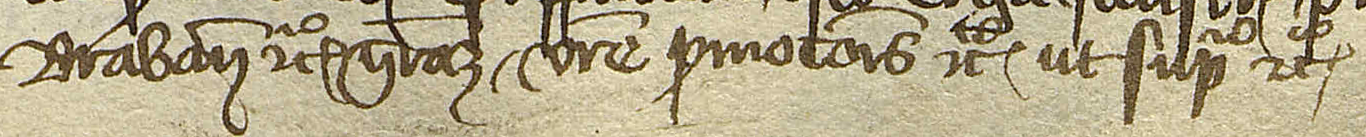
Braban* ec* gra*m / v*re p*mot*on*s ec* ut ſup* ec*
